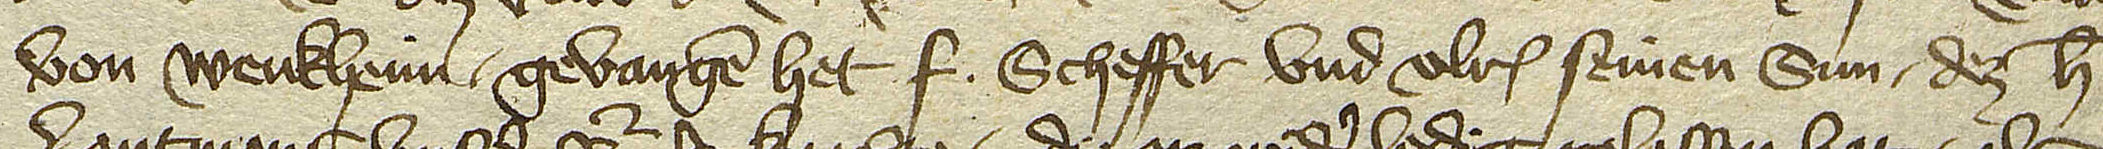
von wenkheim / gevange* het f. Scheffer vnd vlr* ſeinen Sun / deʒ h*
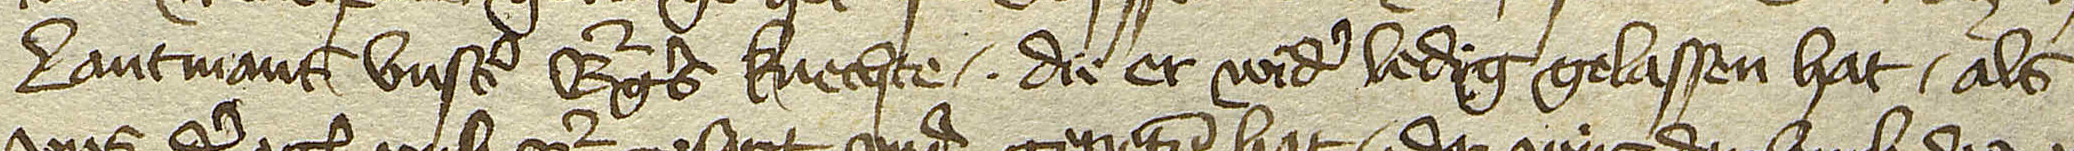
Lantmans vnſs* B*g*s knechte / . die er wid* ledig gelaſſen hat / als
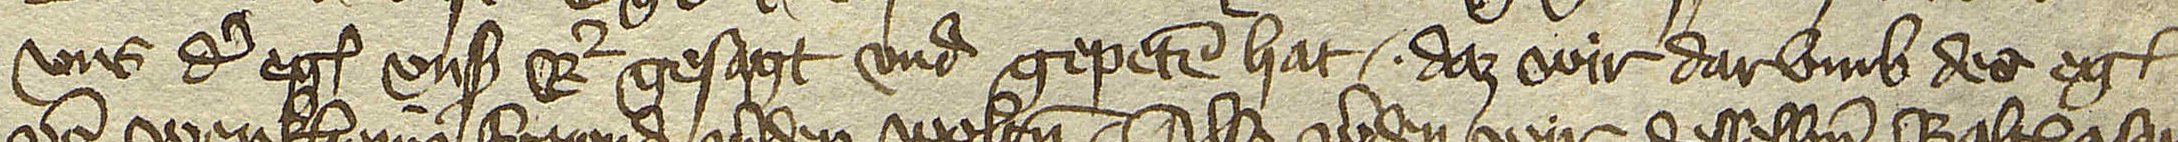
vns d* eg* vnſ* B* geſagt vnd gepete* hat / . daʒ wir darvmb des eg*
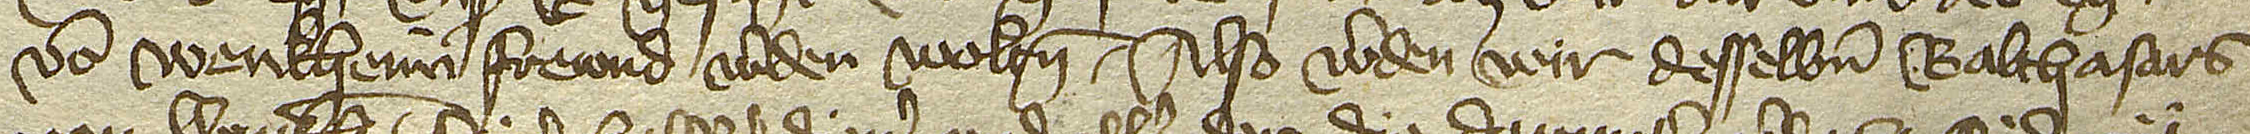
vo* wenkheim frewnd w*den woltn* / Alſo w*den wir deſſelbn* Balthaſars
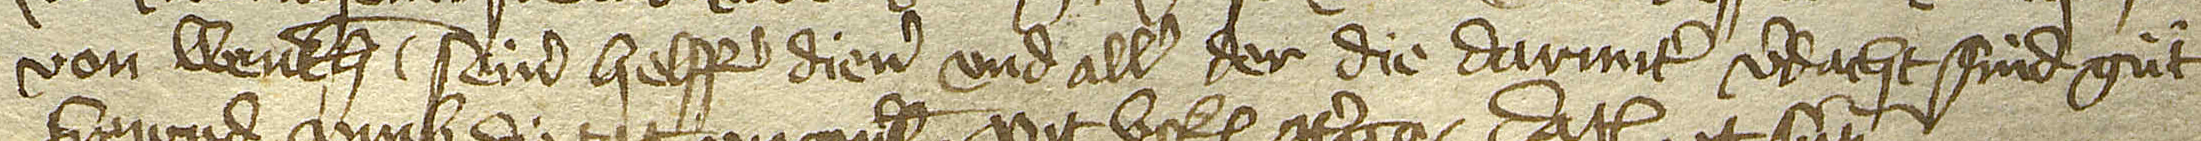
von wenkh* / ſeine* helff* dien* vnd all* der die darunt v*dacht ſind güt
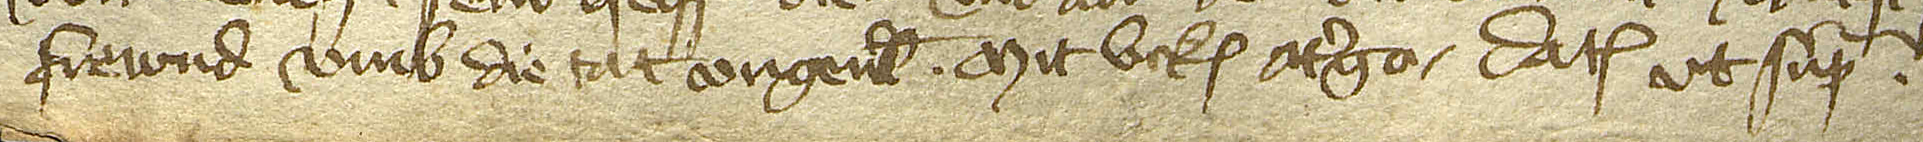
frewnd vmb die tat vngeu*l* . Mit vrk* at*go / Dat* vt ſup* .
